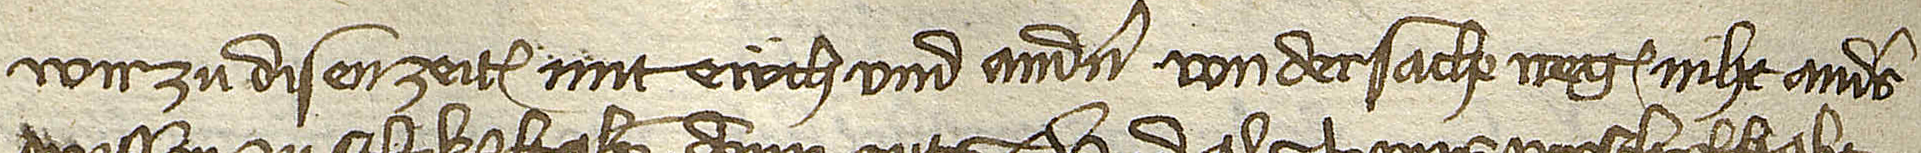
wir ʒu diſen ʒeit* mit eẅch vnd andn* von der ſache weg* niht and*s
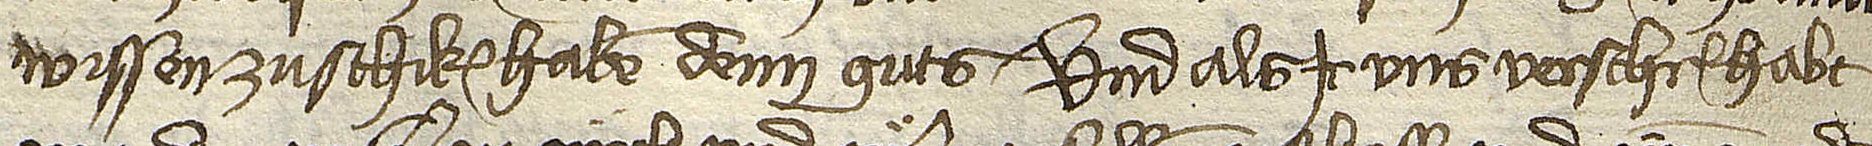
wiſſen ʒu ſchik* habe* denn guts / Vnd als Ir vns verſchr* habt
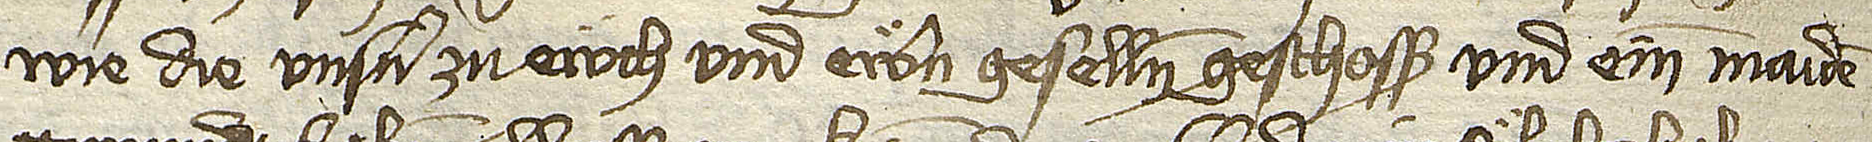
wie die vnſn* ʒu eẅch vnd eẅ*n geſelln* geſchoſſ* vnd ein* maide*
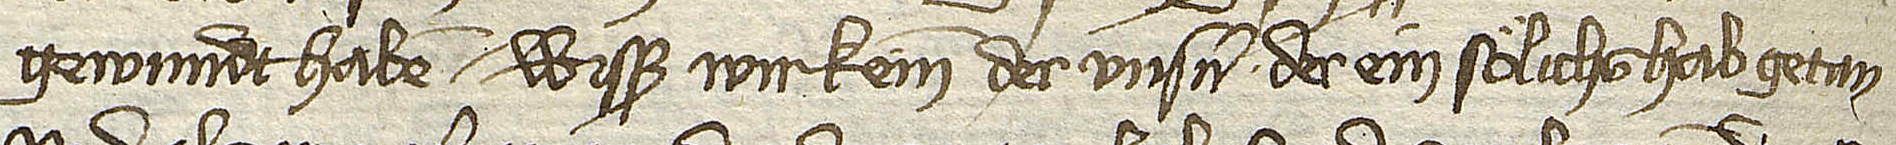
gewundt habe* / Wiſſ* wir kein* der vnſn* . der ein ſölichs hab getan
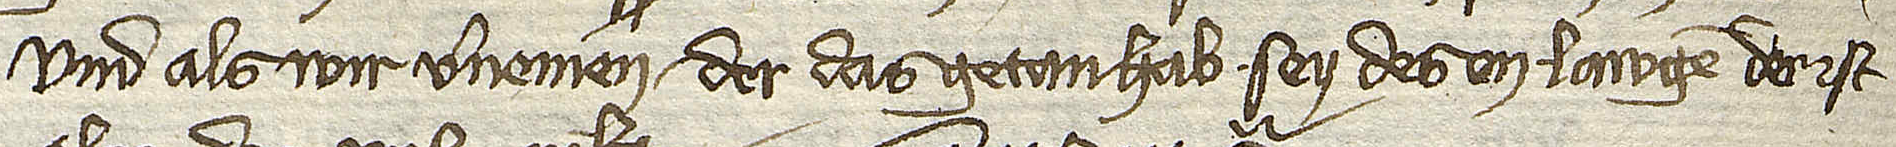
vnd als wir v*nemen / der das getan hab . ſey des on lawge* der iſt
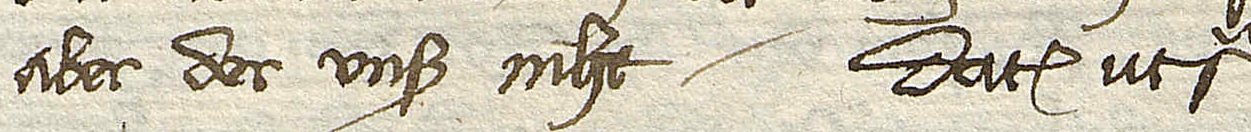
aber der vnſ* niht / Dat* ut ſ*
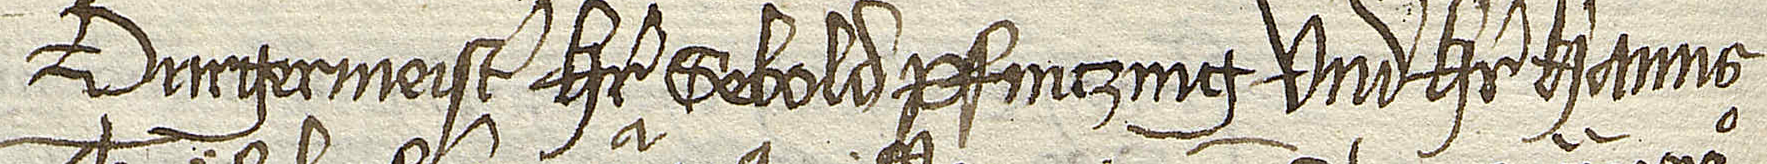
Burgermeiſt* Hr* Sebold Pfincʒing Vnd Hr* Hanns
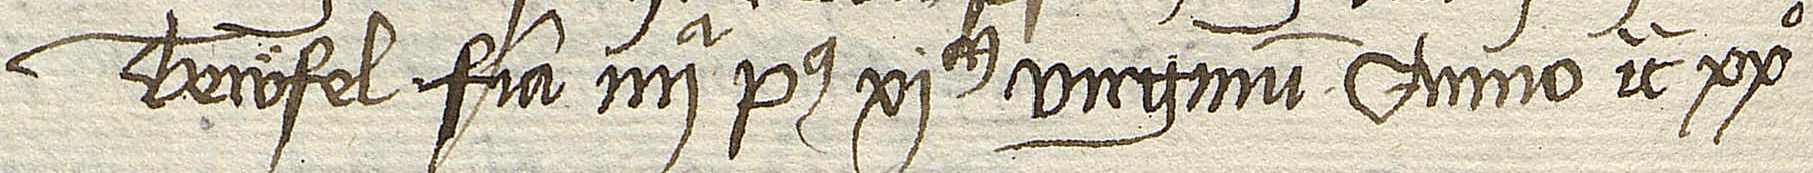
Teẅfel fi*a iiii* p* xi* virginu* Anno ec* xx*
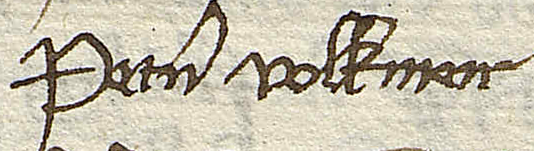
Petn* volkmeir
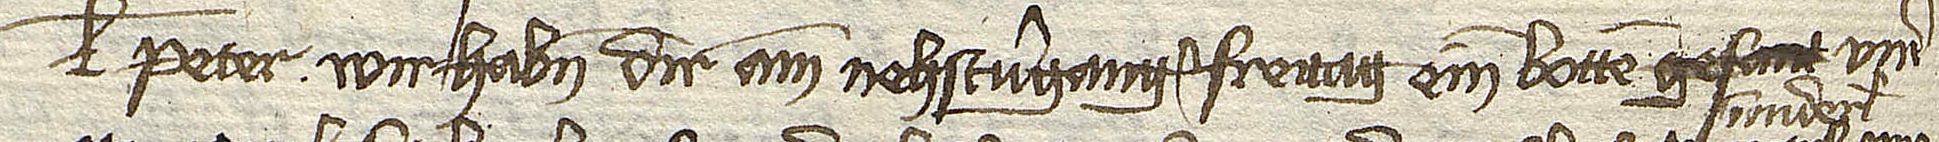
L* Peter . wir habn* die am* nehſtu*gang* freitag ein* botte* geſandt vnd
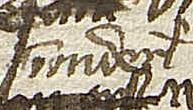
ſunderl*
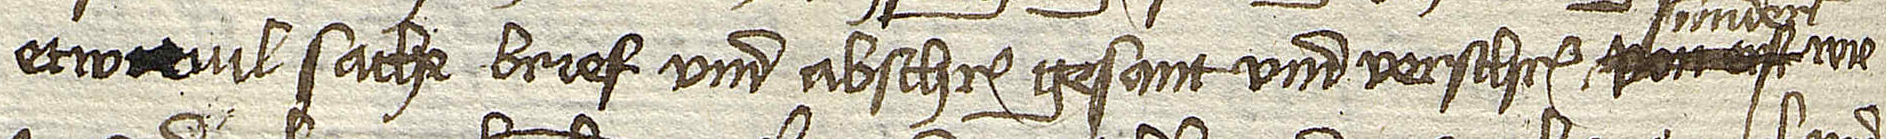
etwieuil ſache brief vnd abſchr* geſant vnd verſchr* von erſt wie
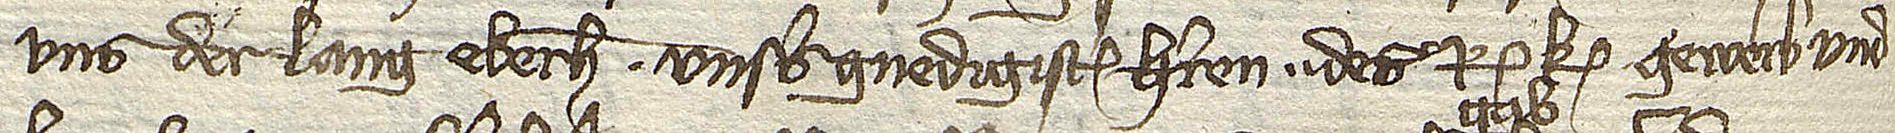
vns der lang eberh* . vnſ*s gnedigiſt* h*ren ~ des R* k* gewerb vnd
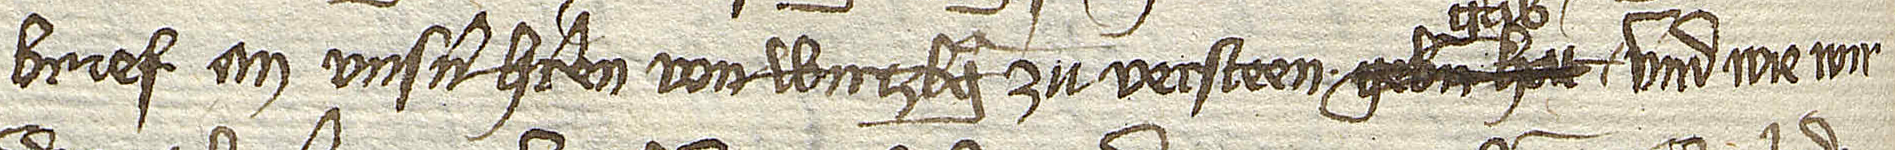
brief an vnſn* h*ren von wircʒb*g ʒu verſteen gebn* hat / Vnd wie wir
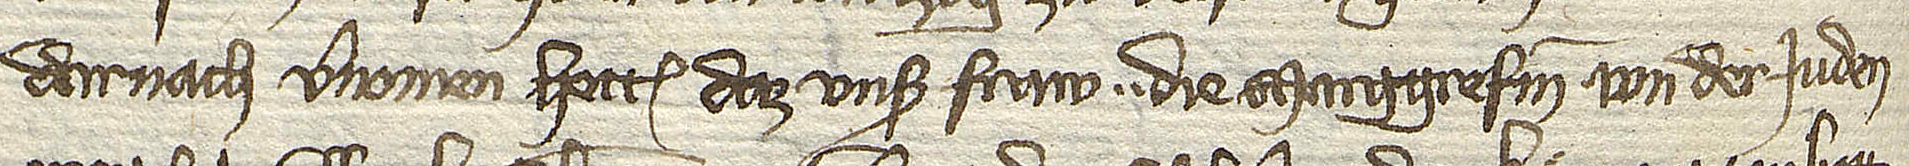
darnach v*nomen hett* daʒ vnſ* fraw ~ die Marggrefin von der Iuden
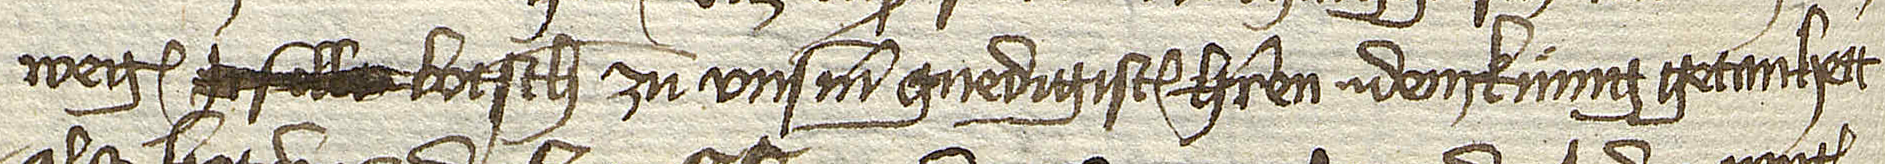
weg* Ir ſelbs botſch* ʒu vnſm* gnedigiſt* h*ren ~ dem künig getan hett
